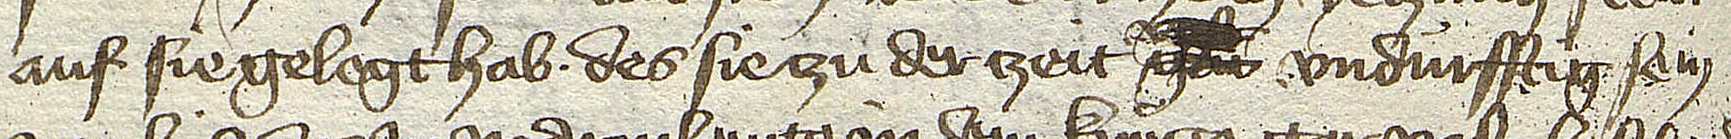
auf ſie gelegt hab . des ſie cʒu der cʒeit gar vndürfftig ſein
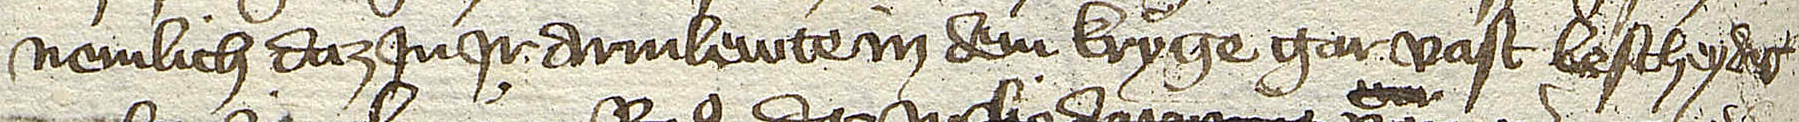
nemlich daʒ In Ir Armlewte in dem kryge gar vaſt beſcheydn*
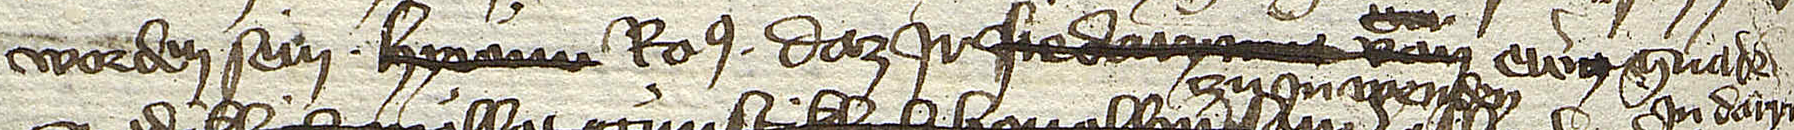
worden ſein . hyrüm Ro* . daʒ Ir ſie darynne von ew*n gnade*
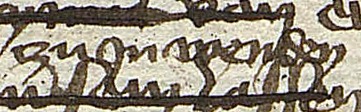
cʒu In wenden
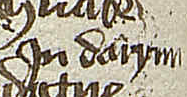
In darynn
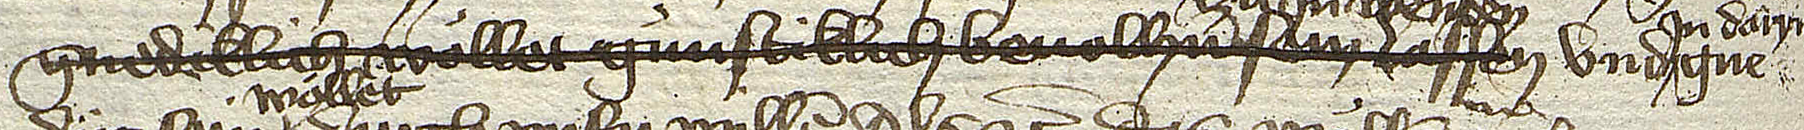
gnediklich wöllet günſtiklich beuolh*n ſein laſſen vnd gne
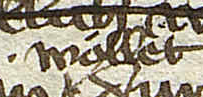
wöllet
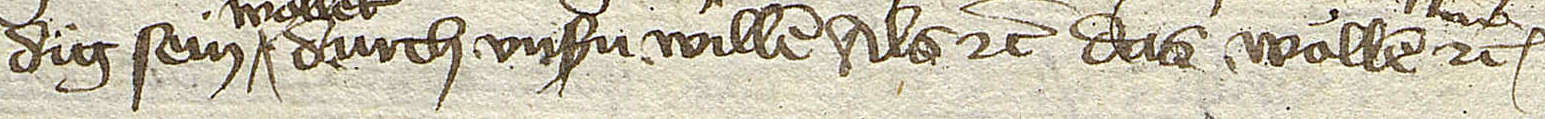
dig ſein durch vnſ*n wille* Als ec* das wölle* ec*
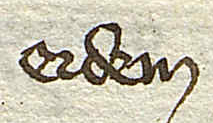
eidem
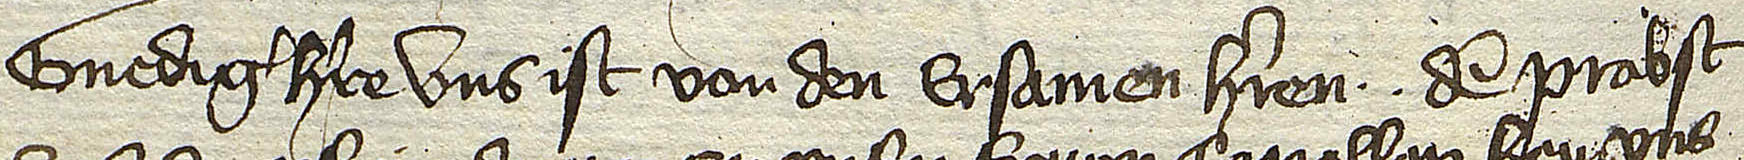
Gnedig* h*re Vns iſt von den Erſamen h*ren ~ d* probſt
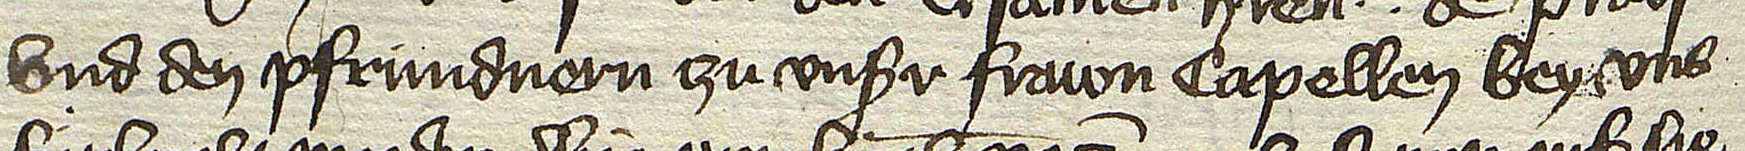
vnd den pründnern cʒu vnſ*r frawn Capellen bey vns
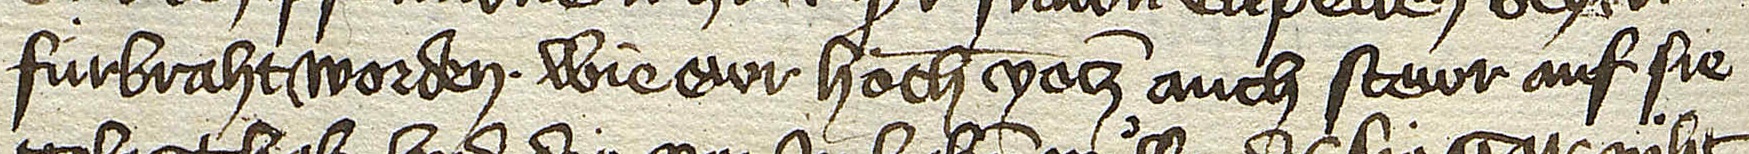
fürbraht worden . wie ewr hoch* yecʒ* auch ſtewr auf ſie
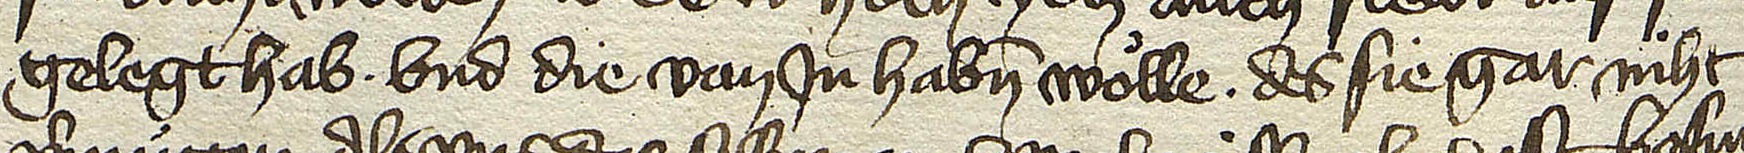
gelegt hab . vnd die von In hab*n wölle . des ſie gar niht
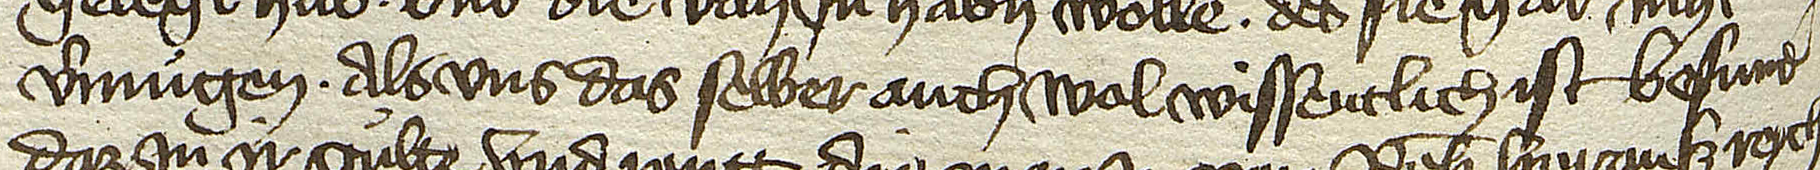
v*mügen . Als vns das ſelber auch wol wiſſentlich iſt beſund*
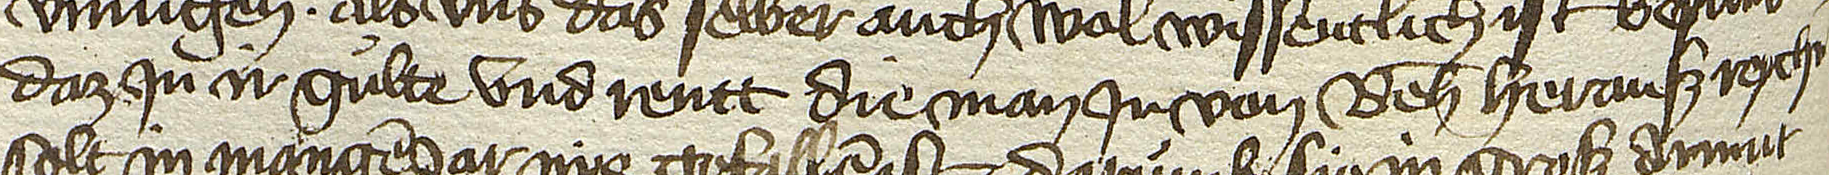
daʒ In ir gülte vnd rentt die man In von Beh* herauſʒ reychn*
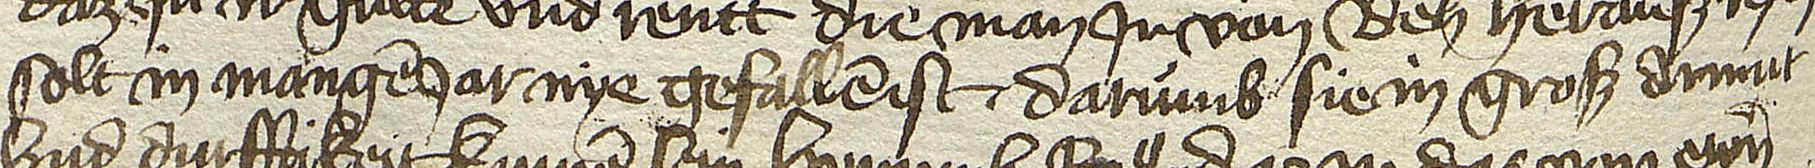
ſolt in mange* Iar nye gefalle* iſt / darümb ſie in groſʒ Armut
